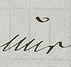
traurig
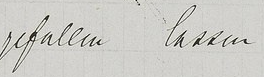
gefallen lassen
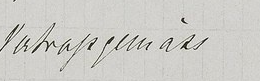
vertragsgemäss
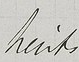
eine
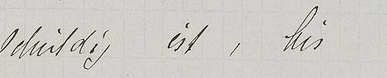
schuldig ist, bis
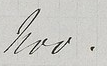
den 1.
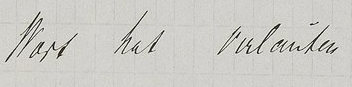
Wort hat verlauten
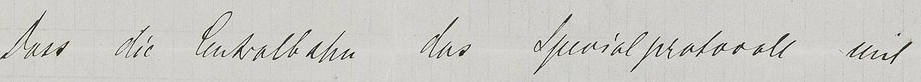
Dass die Centralbahn das Specialprotocoll mit
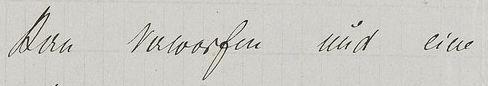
Bern verworfen und eine weitere
